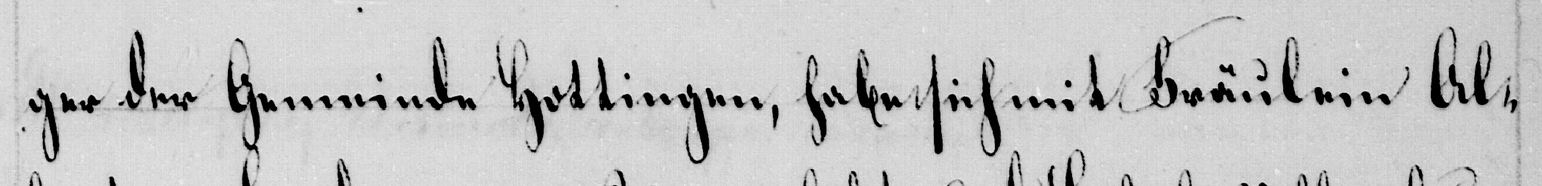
ger der Gemeinde Hottingen, habe sich mit Fräulein Al¬
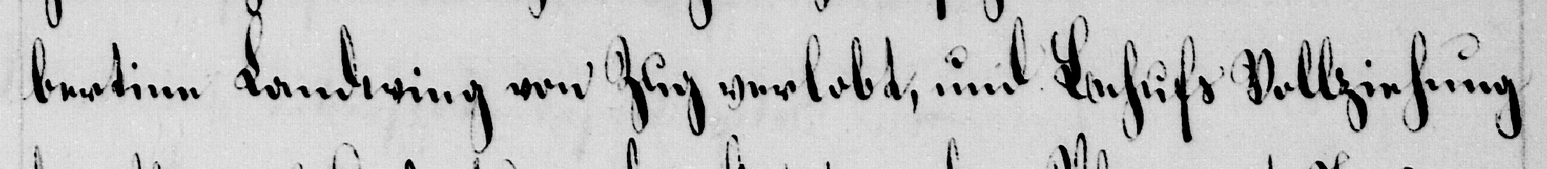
bertina Landwing von Zug verlobt, und Behufs Vollziehung
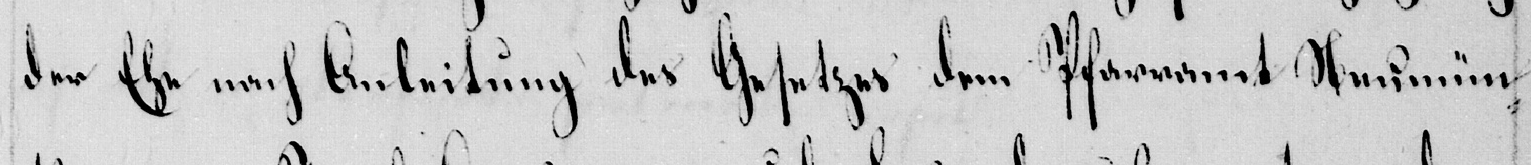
der Ehe nach Anleitung des Gesetzes dem Pfarramt Neumün¬
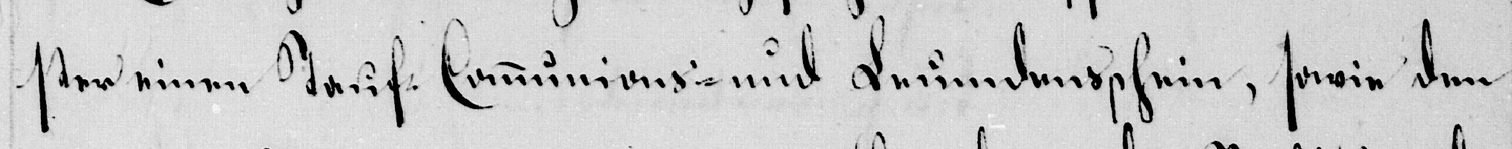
ster einen Tauf- Communions- und Leumdenschein, sowie den
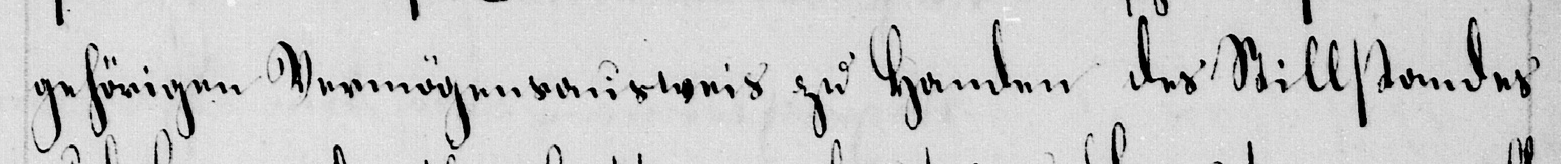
gehörigen Vermögensausweis zu Handen des Stillstandes
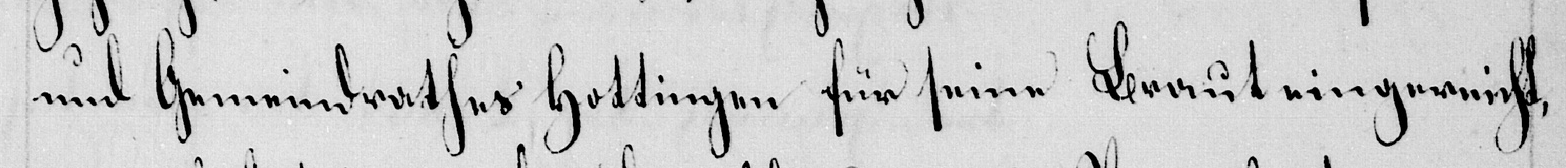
und Gemeindrathes Hottingen für seine Braut eingereicht,
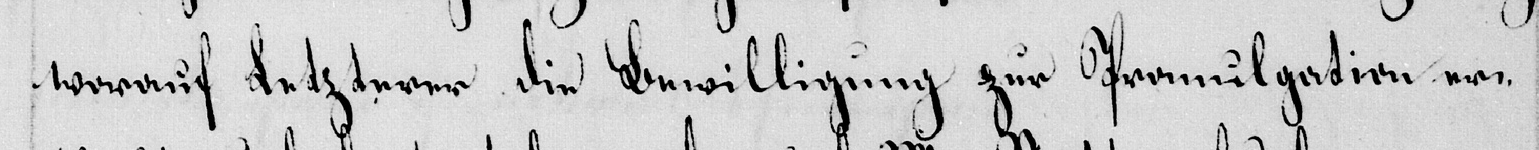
worauf Letzterer die Bewilligung zur Promulgation er¬
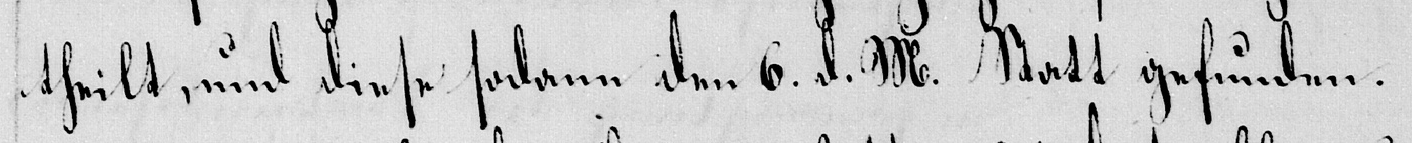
theilt, und diese sodann den 6. d. M. Statt gefunden.
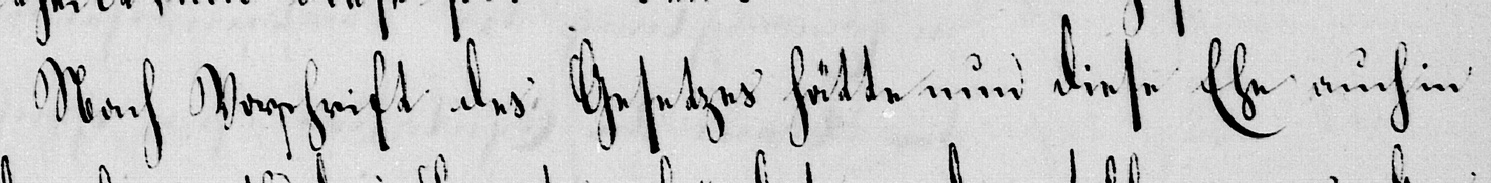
Nach Vorschrift des Gesetzes hätte nun diese Ehe auch in
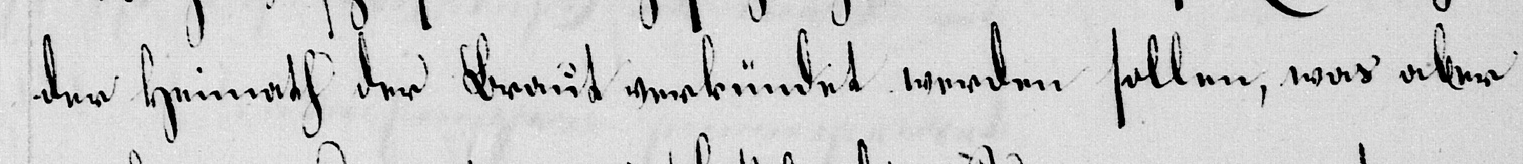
der Heimath der Braut verkündet werden sollen, was aber
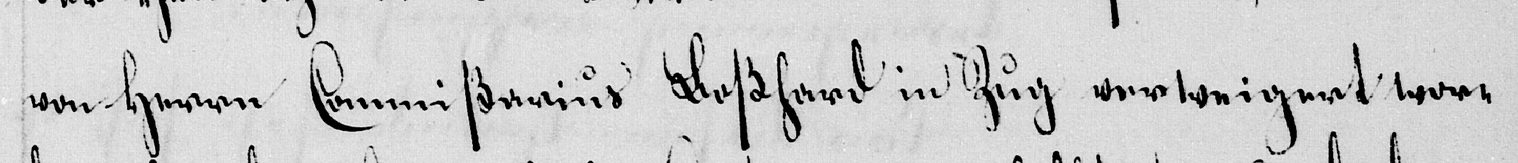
von Herrn Commißarius Boßhard in Zug verweigert wor¬
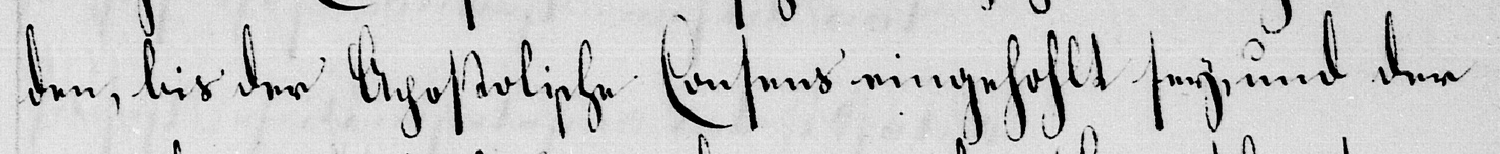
den, bis der Apostolische Consens eingeholt sey, und der
